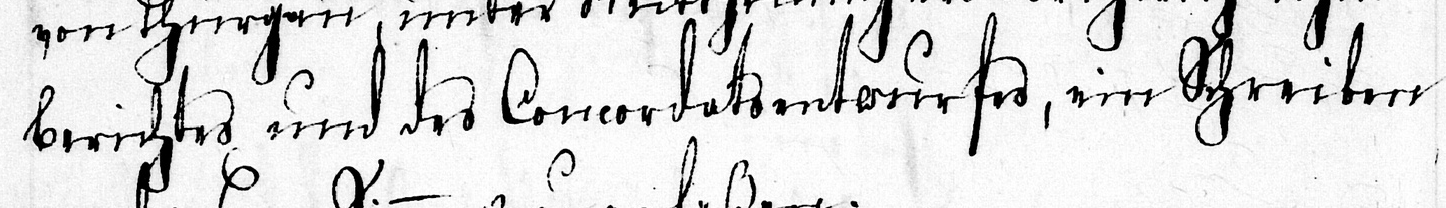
Berichtes und des Concordatsentwurfes, ein Schreiben
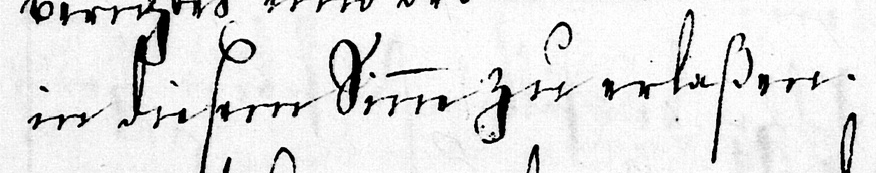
in diesem Sinne zu erlaßen.
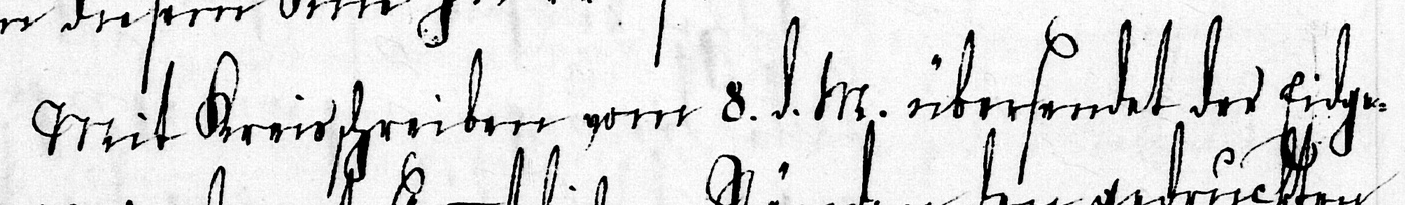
Mit Kreisschreiben vom 8. d. M. übersendet der Eidge¬
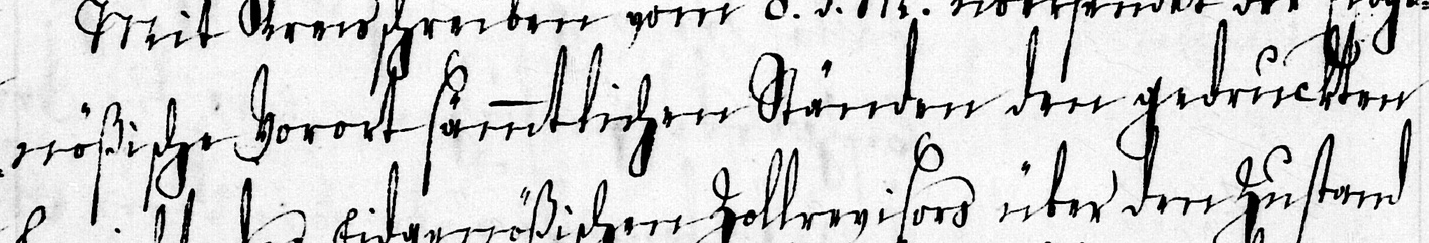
nößische Vorort sämmtlichen Ständen den gedruckten
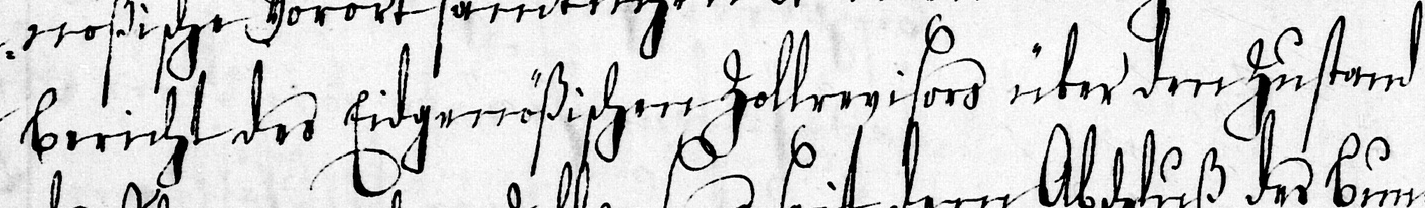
Bericht des Eidgenößischen Zollrevisors über den Zustand
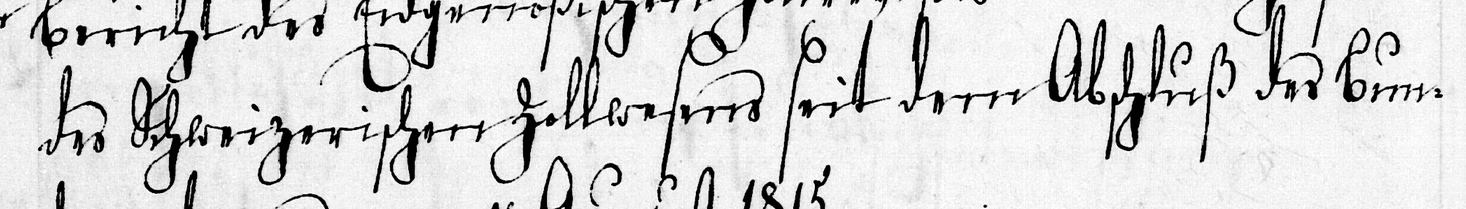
des Schweizerischen Zollwesens seit dem Abschluß des Bun¬
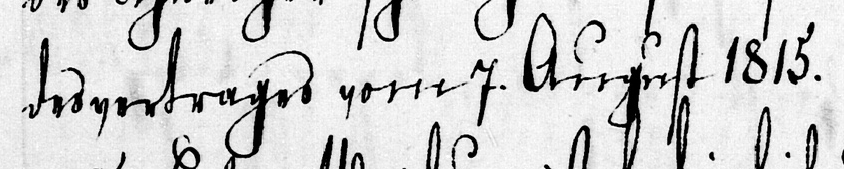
desvertrages vom 7. August 1815.
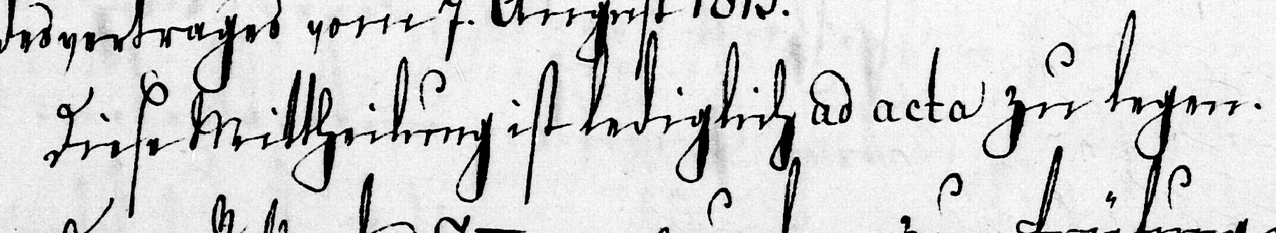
Diese Mittheilung ist lediglich ad acta zu legen.
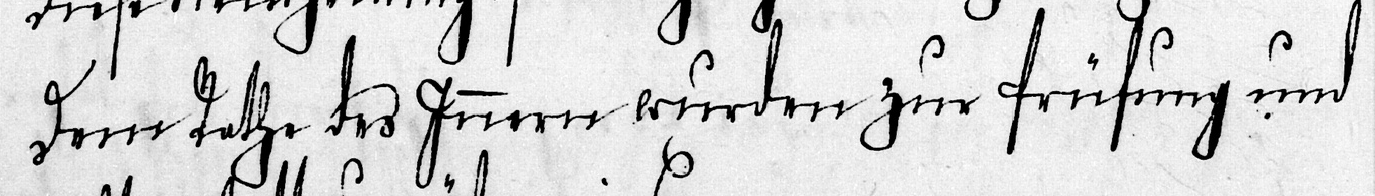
Dem Rathe des Innern wurden zur Prüfung und
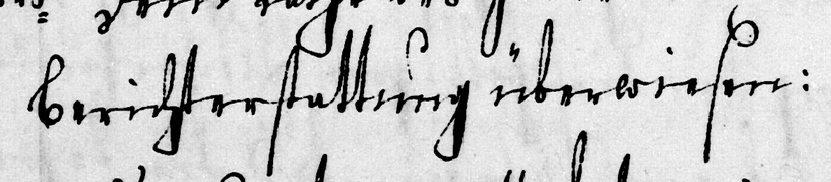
Berichterstattung überwiesen:
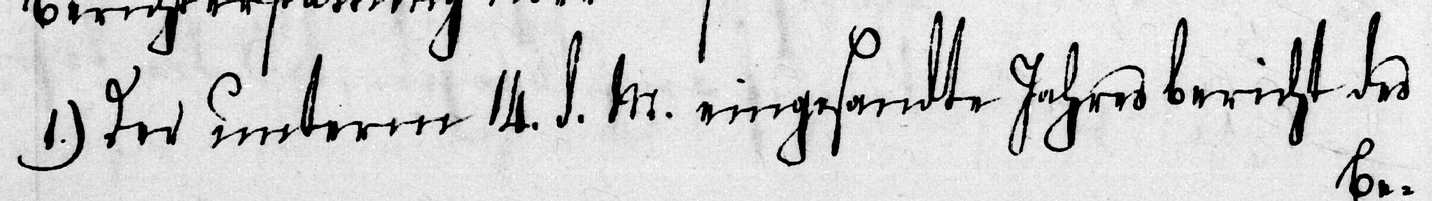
1.) Der unterm 14. d. M. eingesandte Jahresbericht des
